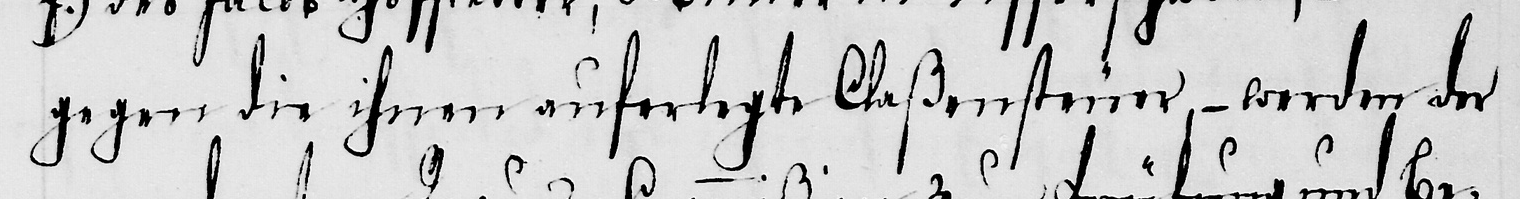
gegen die ihnen auferlegte Claßensteuer, – werden der
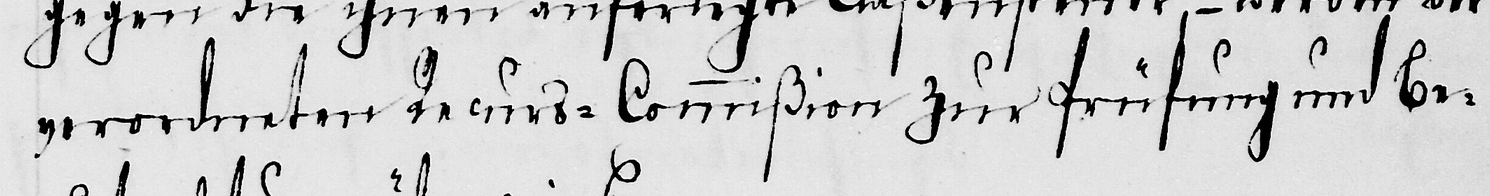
verordneten Recurs-Commißon zur Prüfung und Be¬
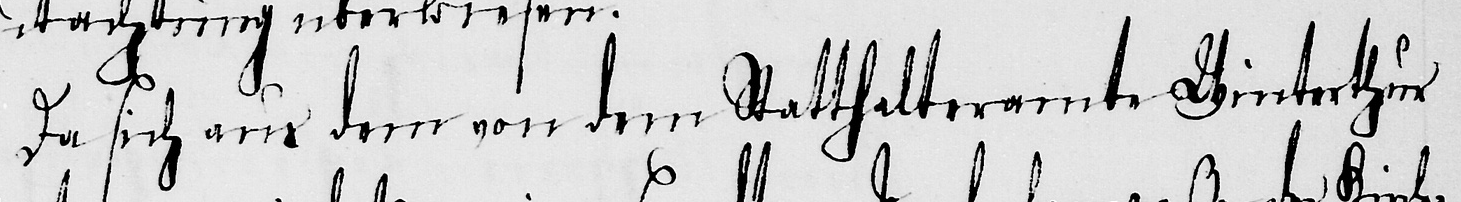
Da sich aus dem von dem Statthalteramte Winterthur
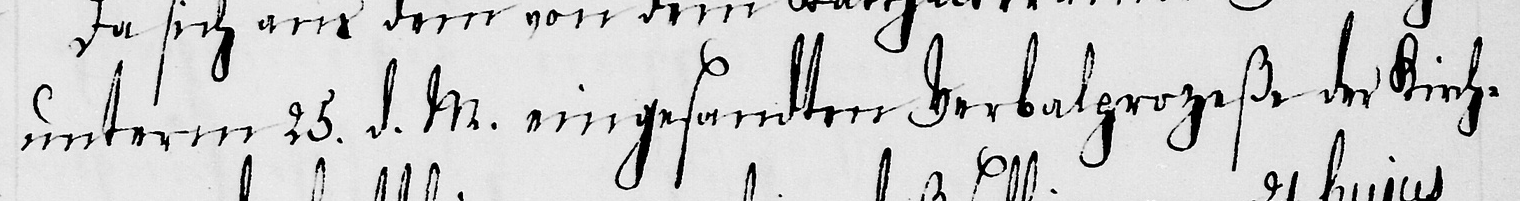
unterm 25. d. M. eingesandten Verbalprozeße der Kirch¬
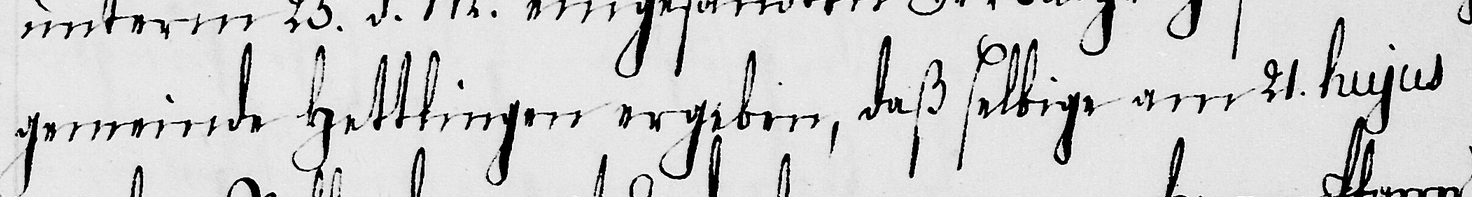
gemeinde Hettlingen ergeben, daß selbige am 21. hujus
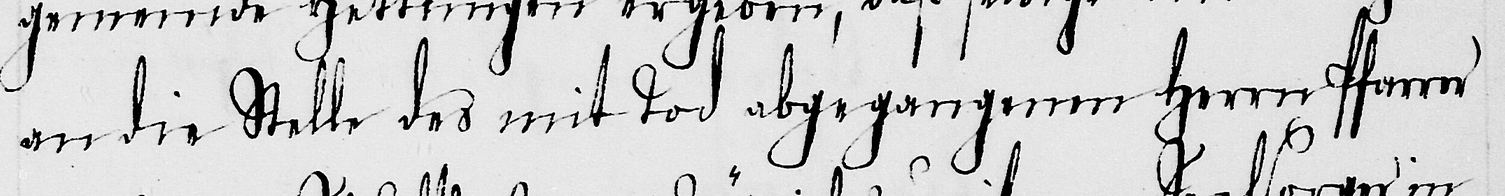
an die Stelle des mit Tod abgegangenen Herrn Pfarrer
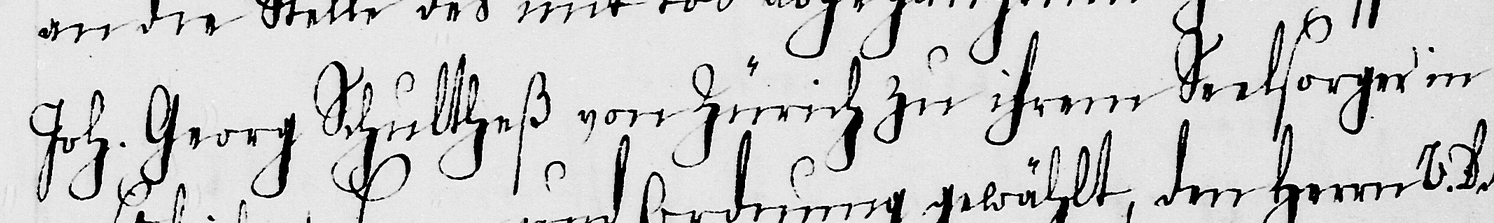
Joh. Georg Schultheß von Zürich zu ihrem Seelsorger in
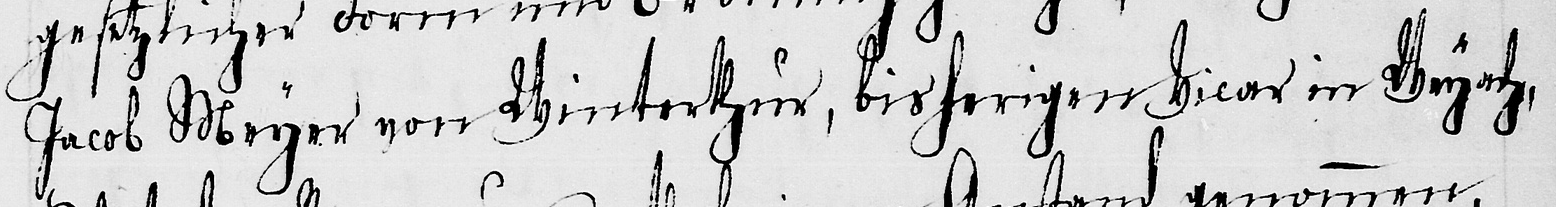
Jacob Meyer von Winterthur, bisherigen Vicar in Weyach,
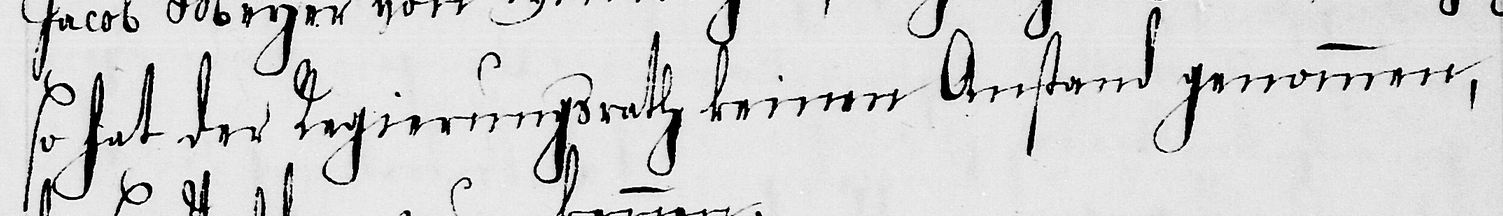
so hat der Regierungsrath keinen Anstand genommen,
